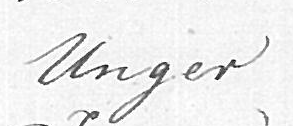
Unger
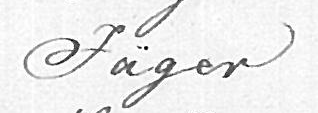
Jäger
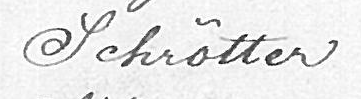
Schrötter
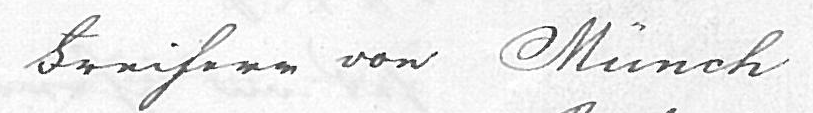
Freiherr von Münch
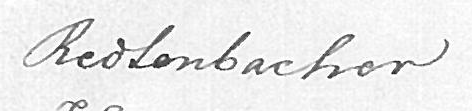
Redtenbacher
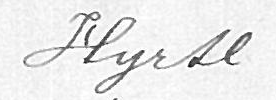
Hyrtl
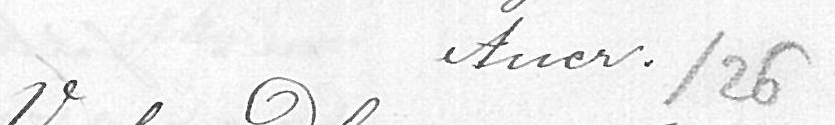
Auer
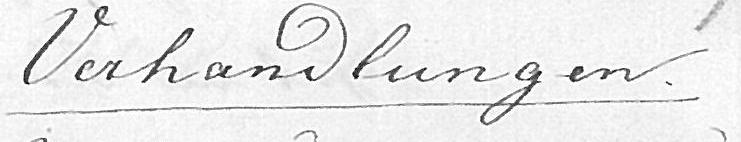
Verhandlungen.
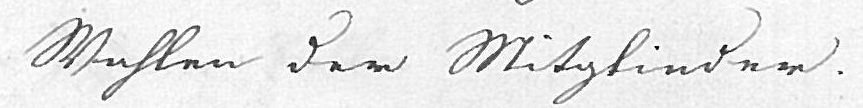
Wahlen der Mitglieder.
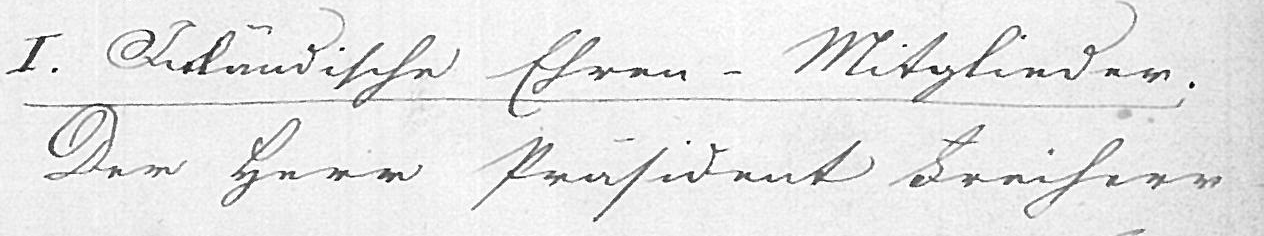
I. Inländische Ehren-Mitglieder.
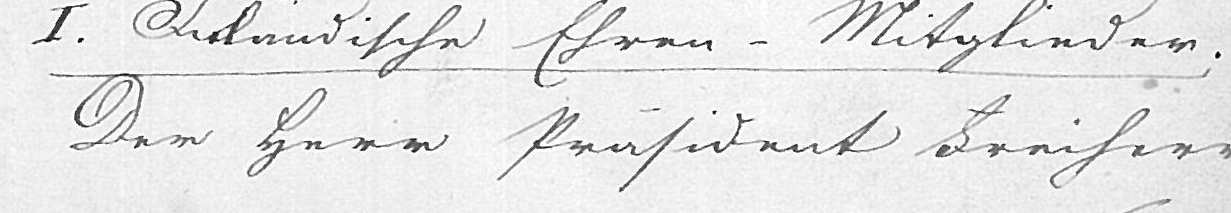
Der Herr Präsident Freiherr
